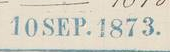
21 août – 1873.
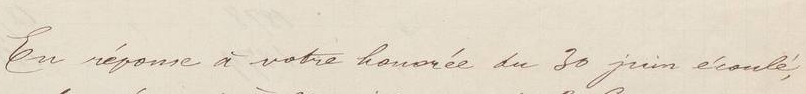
En réponse à votre honorée du 30 juin écoulé,
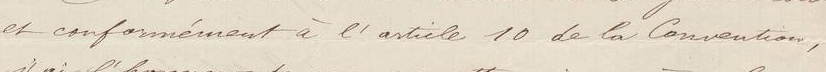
et conformément à l'article 10 de la Convention,
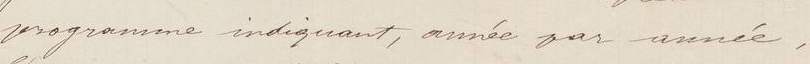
programme indiquant, année par année,
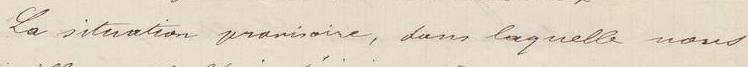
La situation provisoire, dans laquelle nous
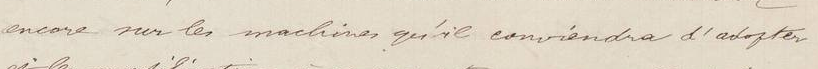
encore sur les machines qu'il conviendra d'adopter
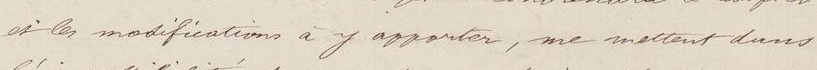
et les modifications à y apporter, me mettent dans
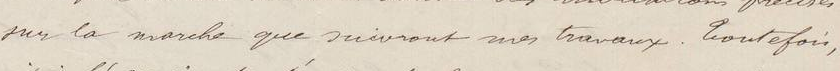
sur la marche que suivront mes travaux. Toutefois,
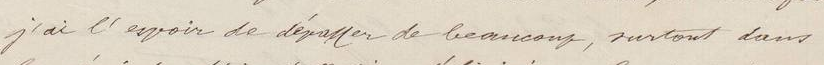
j'ai l'espoir de dépasser de beaucoup, surtout dans
